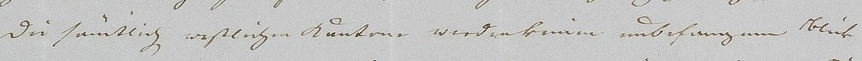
Die sämtlichen westlichen Kantone werden keinen unbefangnen Blick
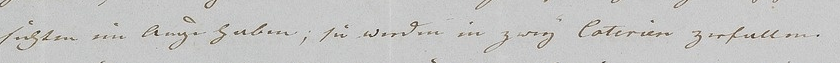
sichten im Auge haben; sie werden in zwey Coterien zerfallen.
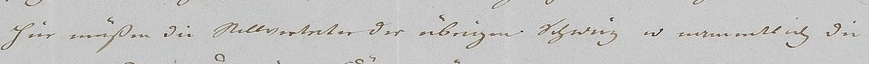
Hier müßen die Stellvertreter der übrigen Schweiz u namentlich die
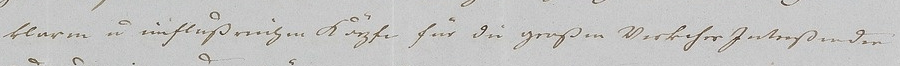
klaren u einflußreichen Köpfe für die großen Verkehrs Intreßen der
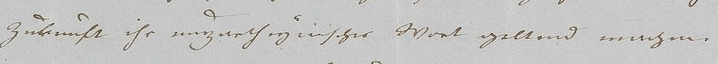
Zukunft ihr unpartheyisches Wort geltend machen.
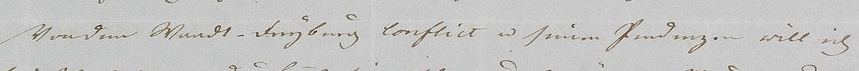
Von dem Waadt-Freyburg Conflict u seinen Pendenzen will ich
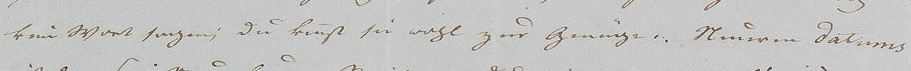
kein Wort sagen; Du kennst sie wohl zur Genüge. Neueren Datums
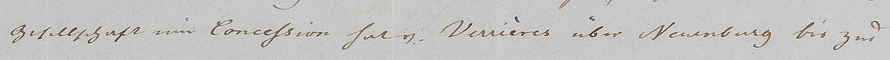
Gesellschaft eine Concession hat v. Verrières über Neuenburg bis zur
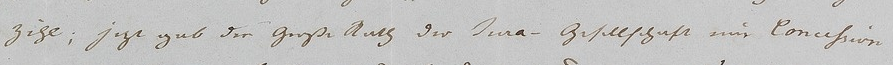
Zihl; jetzt gab der Große Rath der Jura-Gesellschaft eine Concession
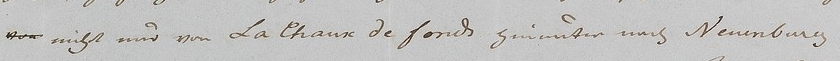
von nicht nur von La Chaux de Fonds hinunter nach Neuenburg,
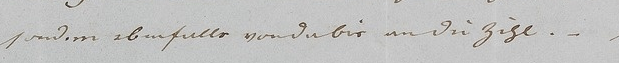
sondern ebenfalls von da bis an die Zihl. – Die
